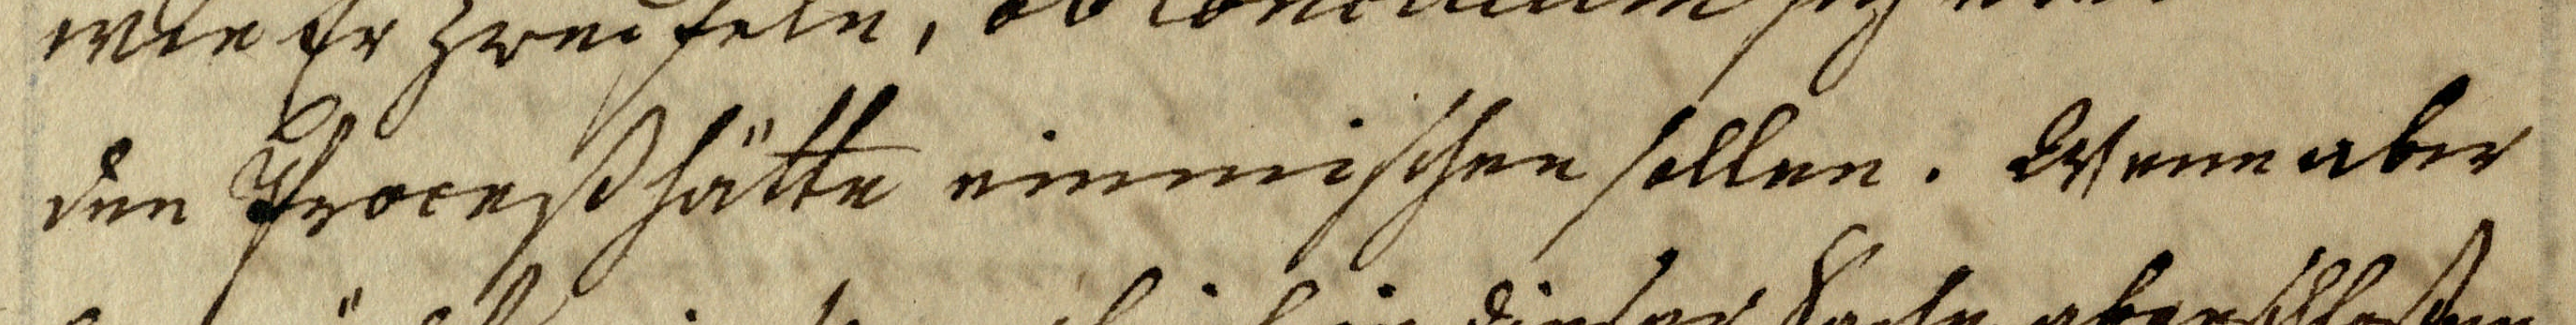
den Proceß hätte eimmischen sollen. Wenn aber
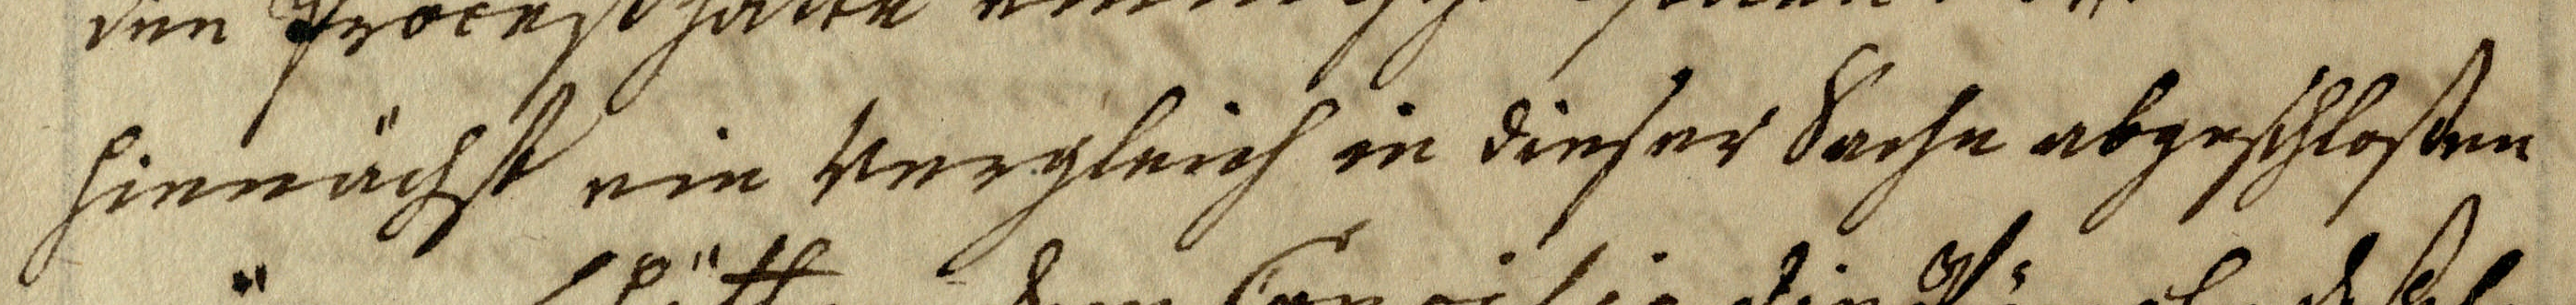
hienächst ein Vergleich in dieser Sache abgeschloßen
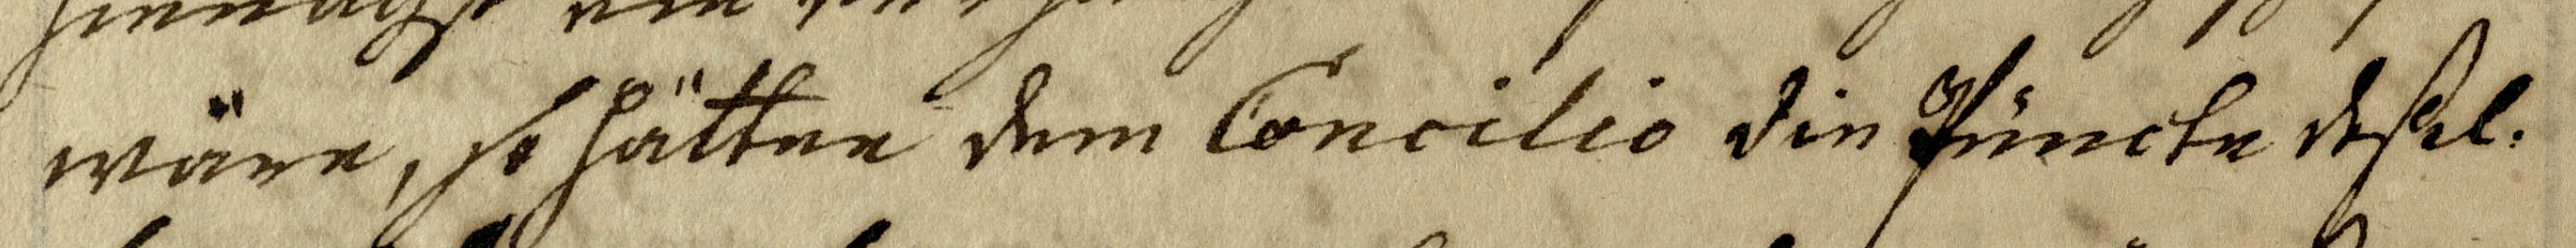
wäre, so hätten dem Concilio die Puncte deßel¬
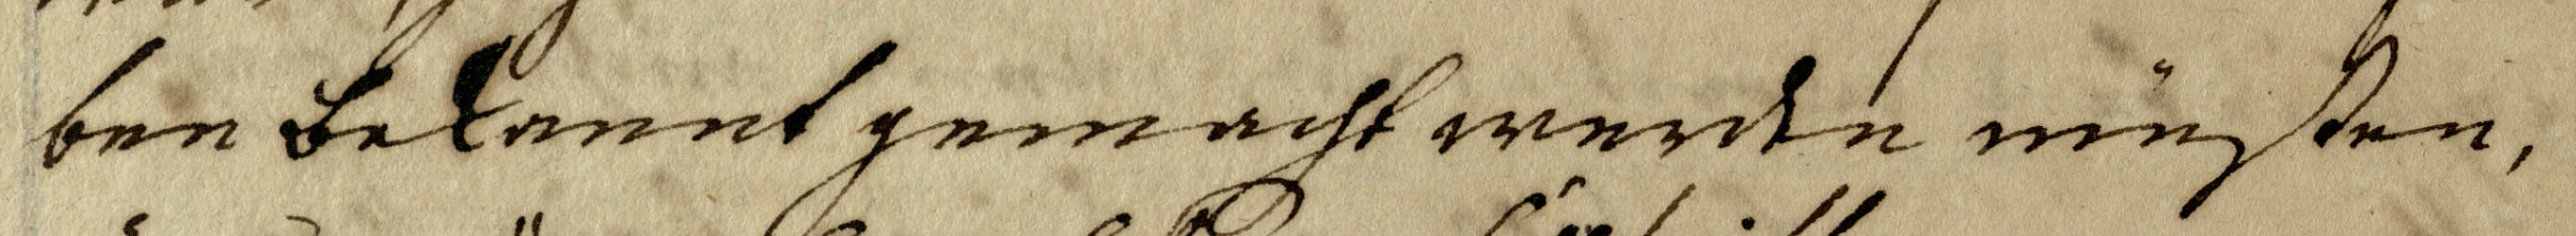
ben bekannt gemacht werden müßen,
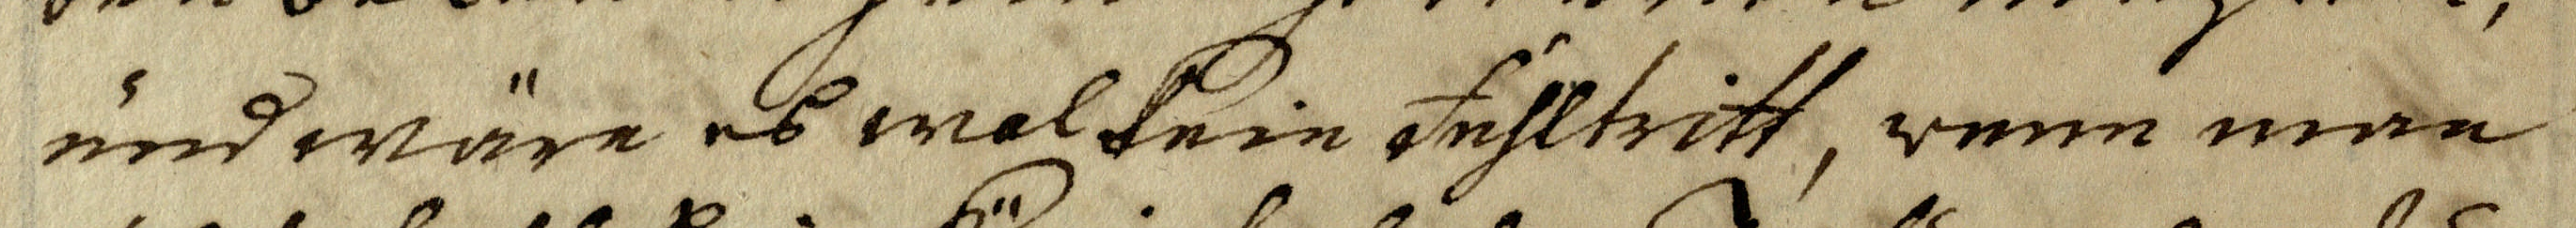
und wäre es wol kein Fehltritt, wenn man
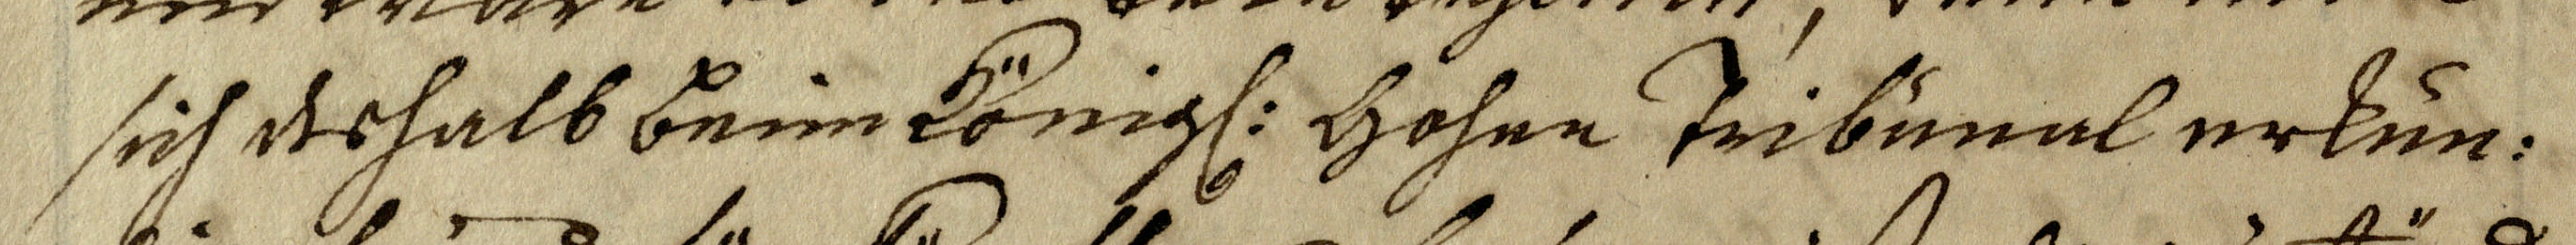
sich deshalb beim Königl. Hohen Tribunal erkun¬
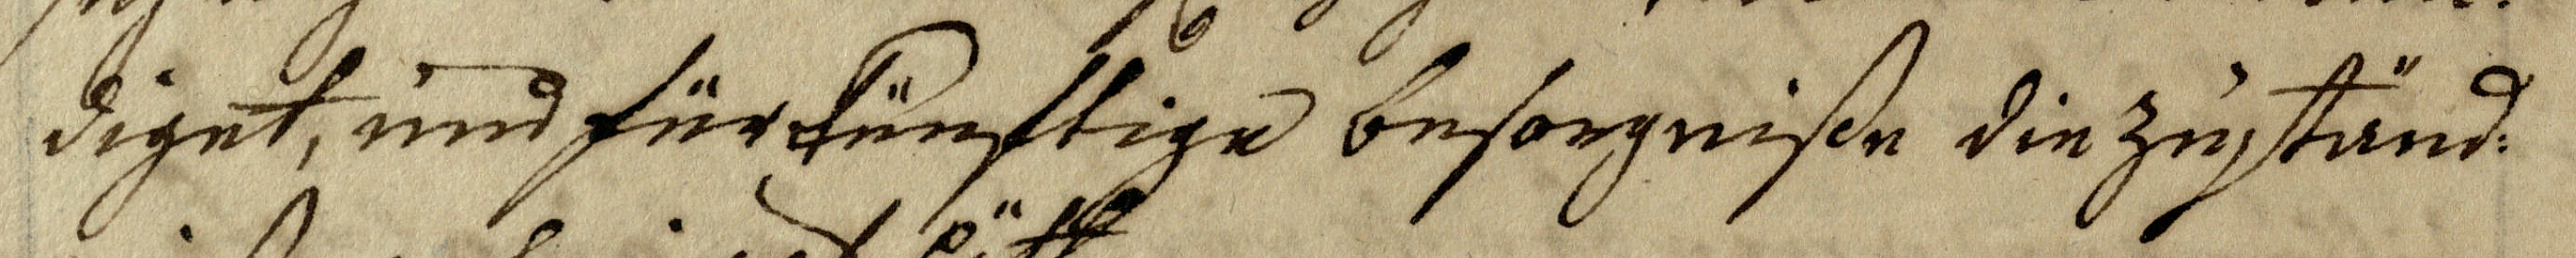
diget und für künftige Besorgniße die Zuständ¬
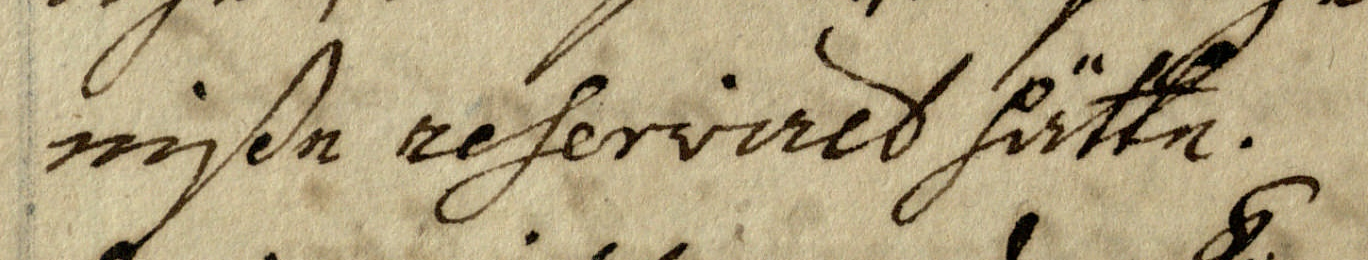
niße reserviret hätte.
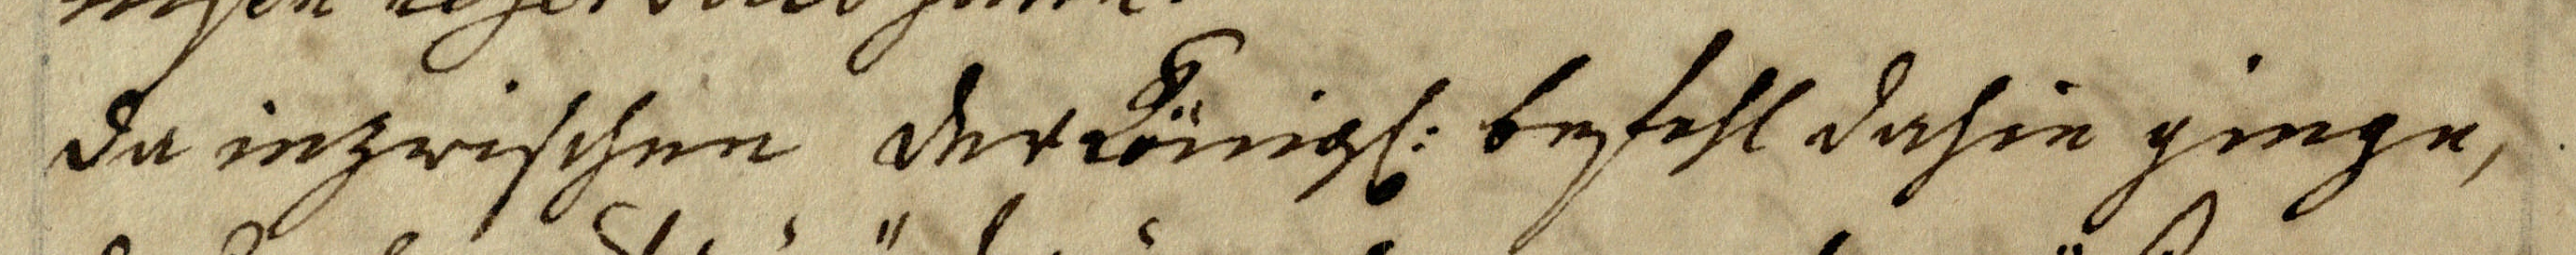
Da inzwischen der Königl. Befehl dahin ginge,
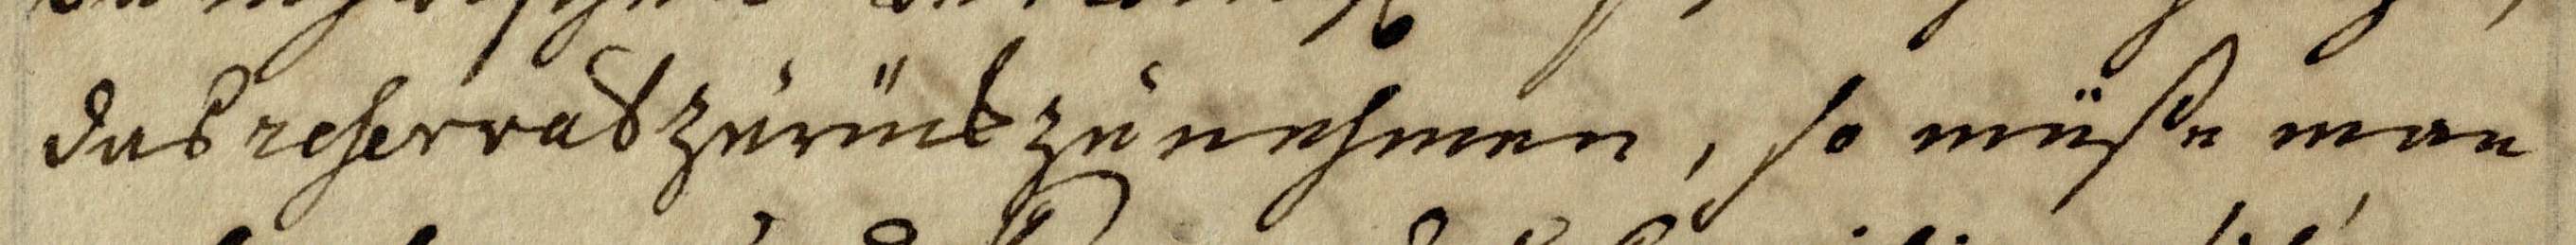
das reservat zurück zu nehmen, so müße man
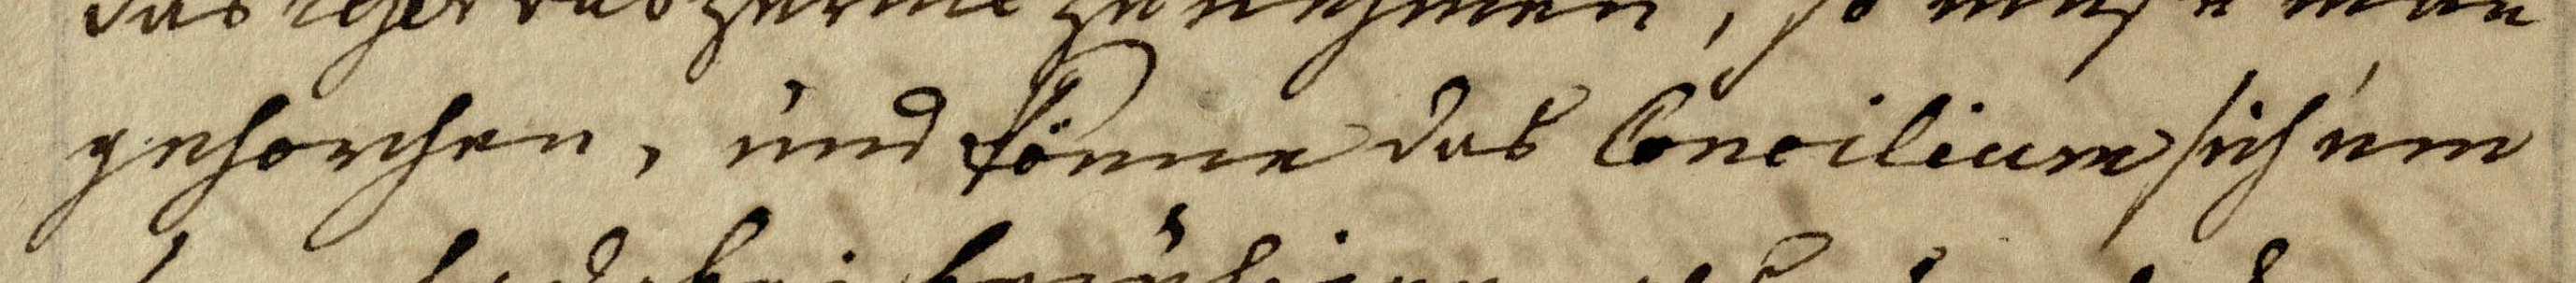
gehorchen, und könne das Concilium sich um
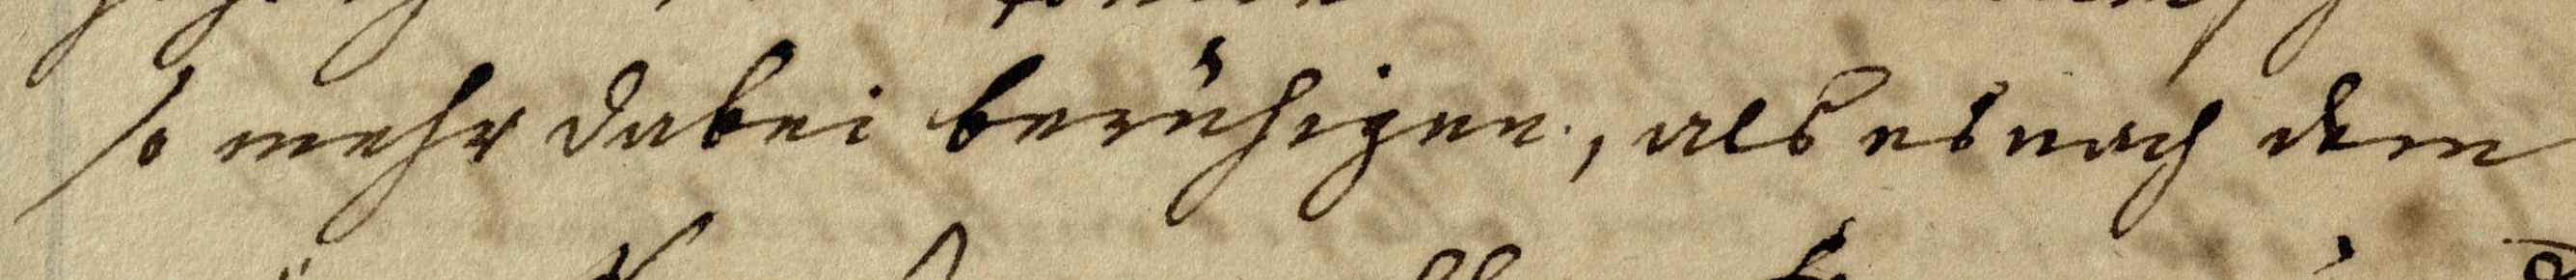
so mehr dabei beruhigen, als es nach dem
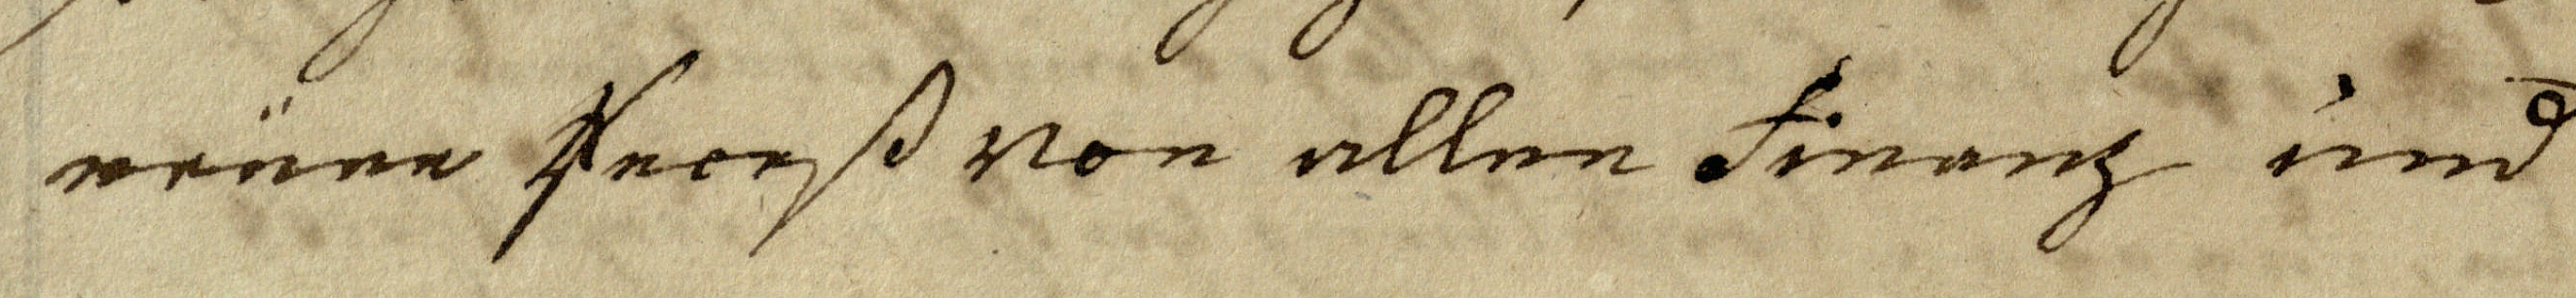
neuen Receß von allen Finanz und
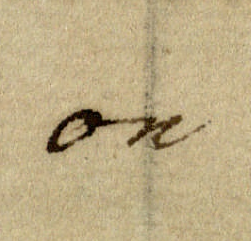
oe
